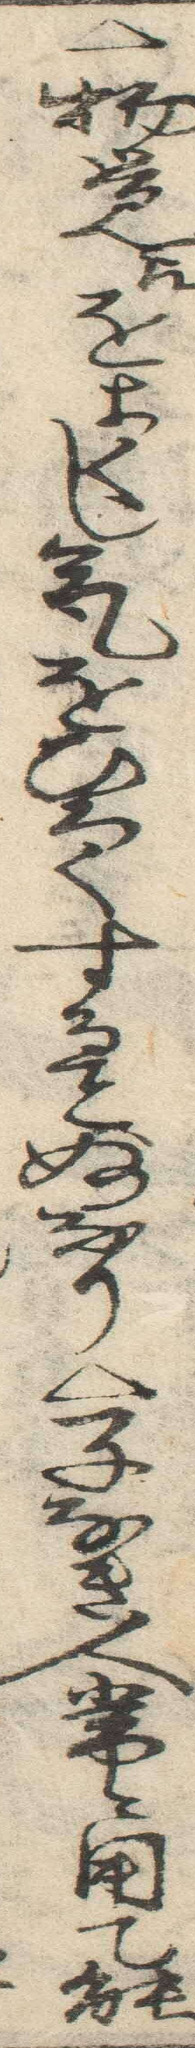△物覚これをよくし気をひろくすること妙なり△子なき人常に用て能
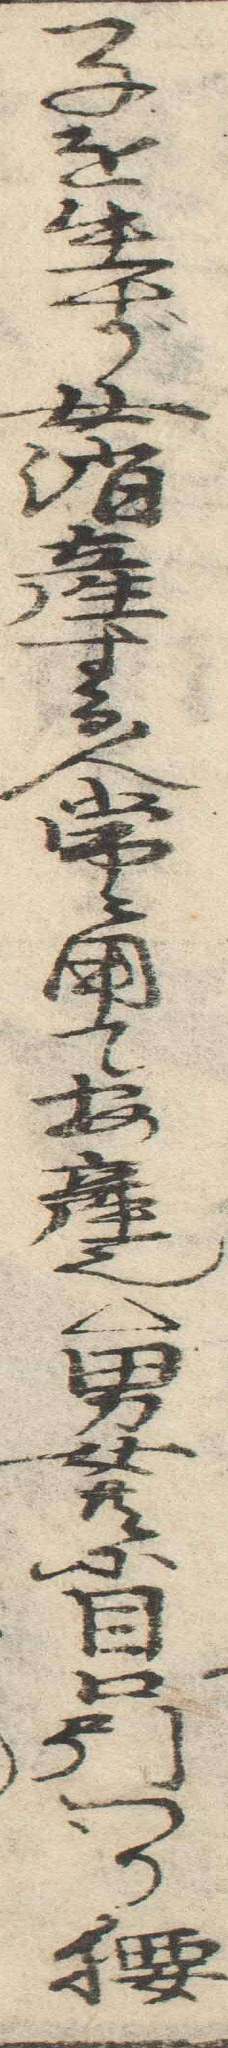子を生ず女消産する人常に用て安産也△男女共に目口引つり腰
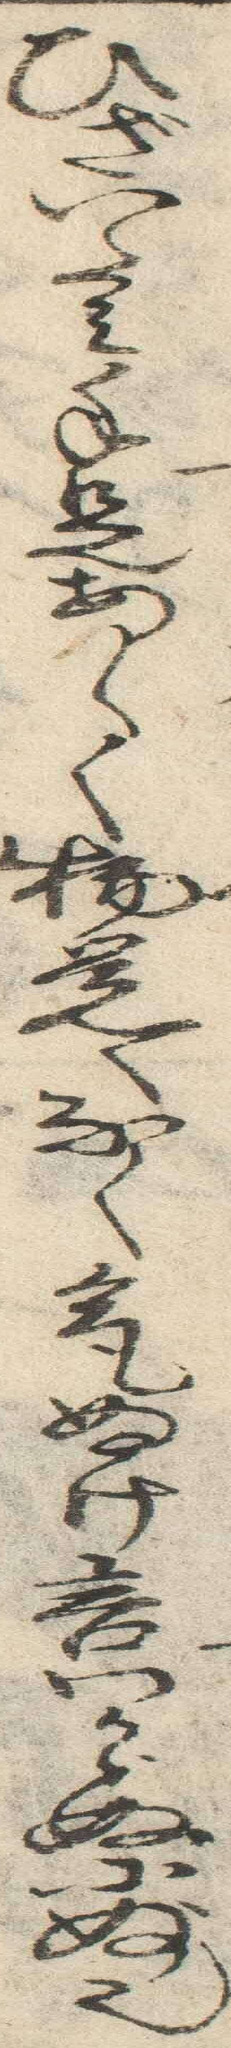ひざいたみ手足あしく物覚へなく気ぬけ言わからぬに妙也
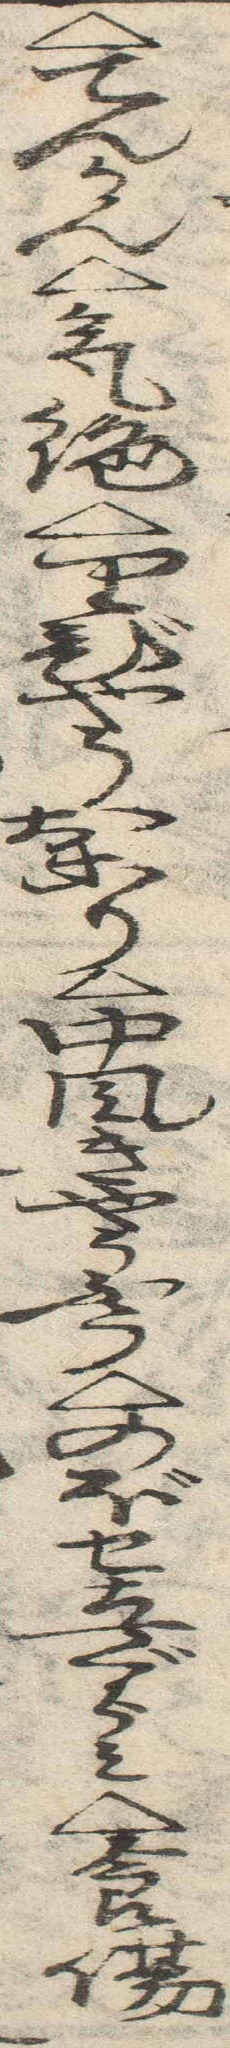△てんかん△気絶△りびやうおこり△中風きやうふう△のぼせ立ぐらみ△食傷
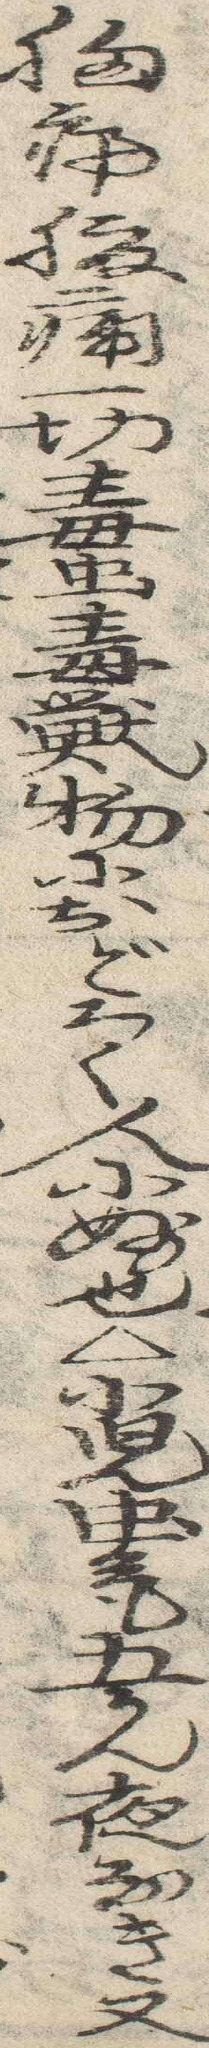胸痛腹痛一切毒虫毒獣物におどろく人に妙也△小児虫気五かん夜なき又
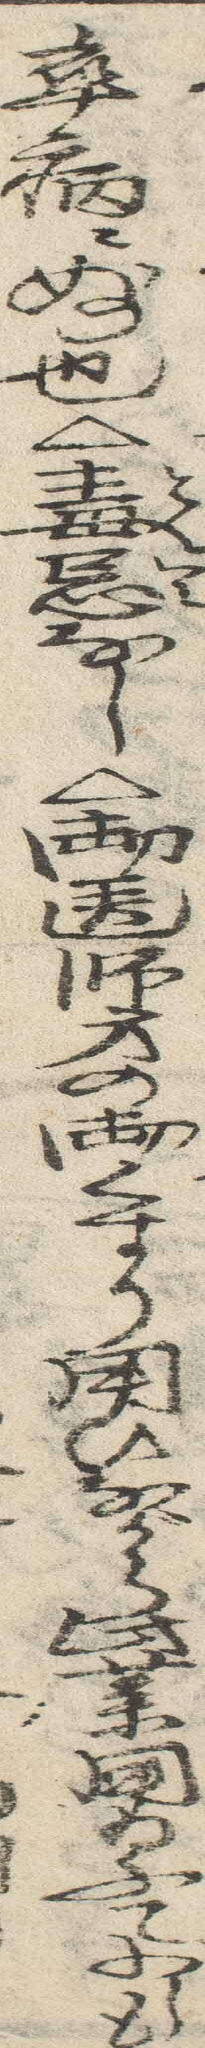卒病に妙也△毒忌なし△御医師方の御くすり用ひながら此薬用給ふて少しも
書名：撫育草
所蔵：東京学芸大学附属図書館 国文学研究資料館
